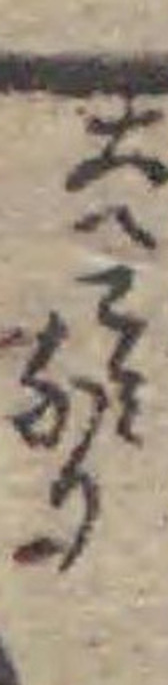大へこみなり
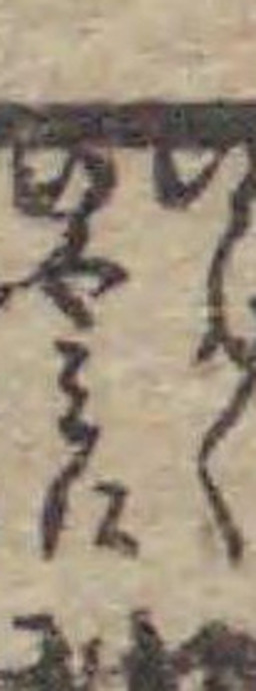いやみに
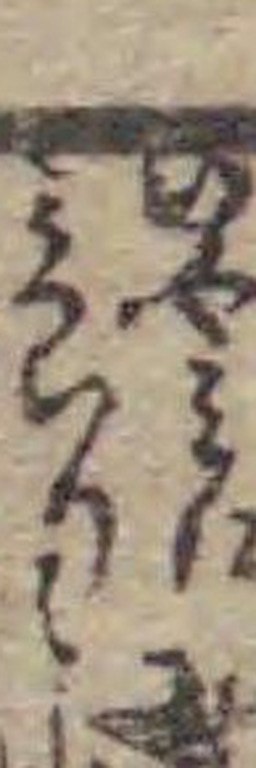みかいりて
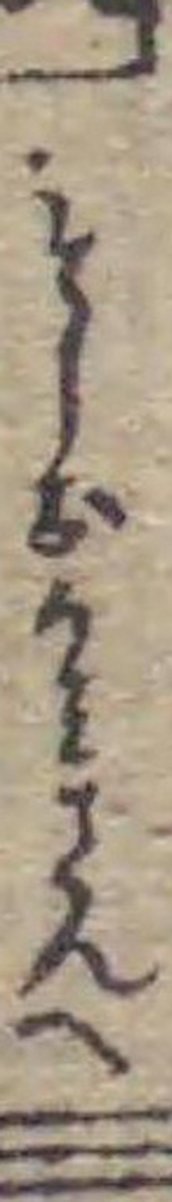もしおかみさんへ
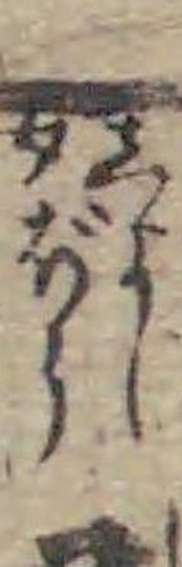女ぼう
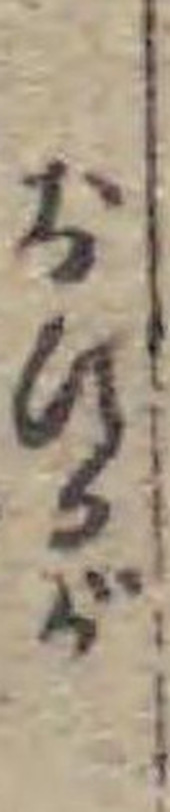おひるが
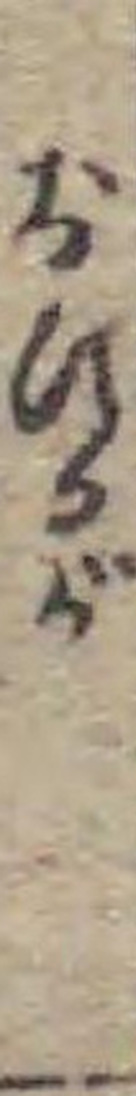おひるが
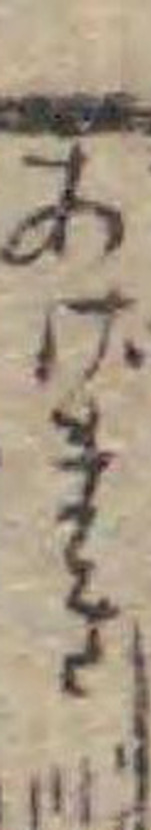あげまき
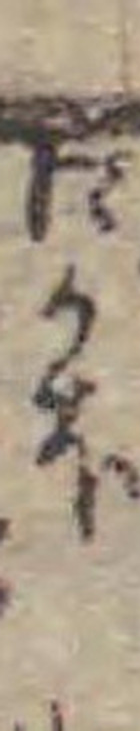にかほ
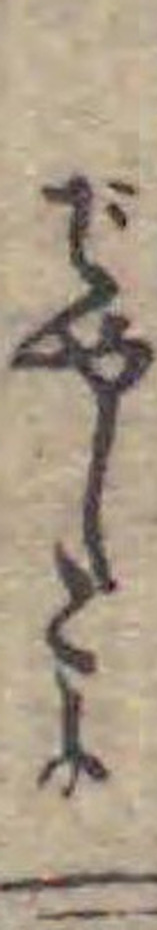でやしてよ
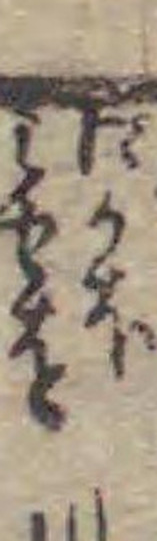みせを
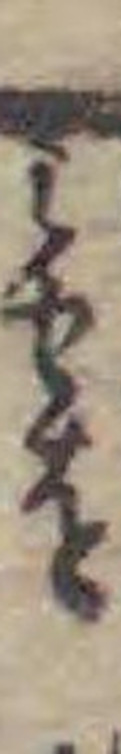みせを
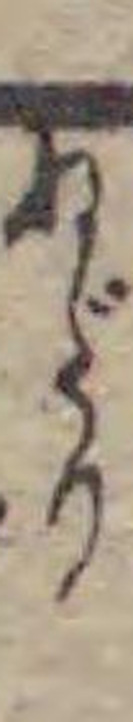ねだり
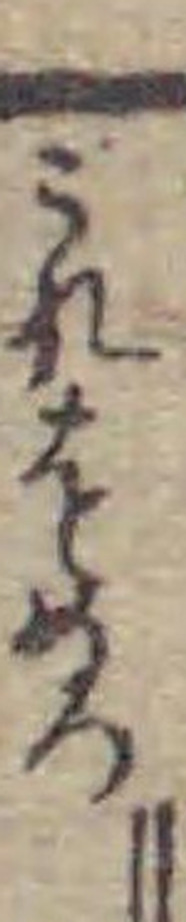これをぬつ
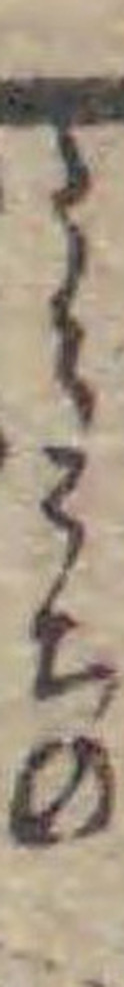たらうちの
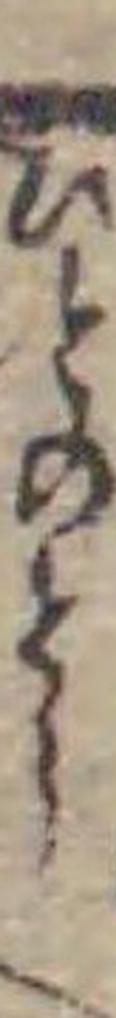ひとのとう
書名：江戸花俳優贔屓 : 3巻
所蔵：国立国会図書館 National Diet Library, JAPAN
